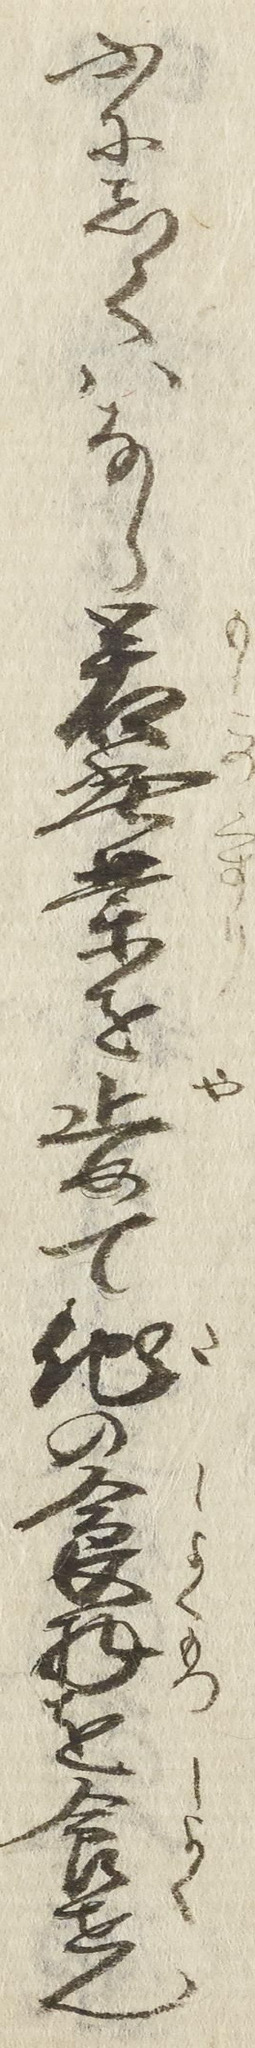ふにしくはなし若此薬を止めて他の食物を食せん
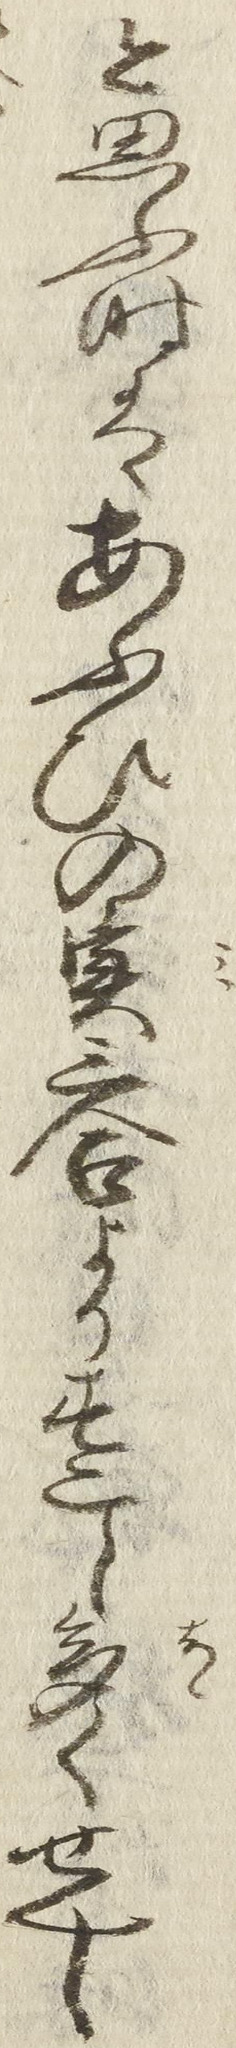と思ふ時はあふひの実三合よりすこし多くせんし
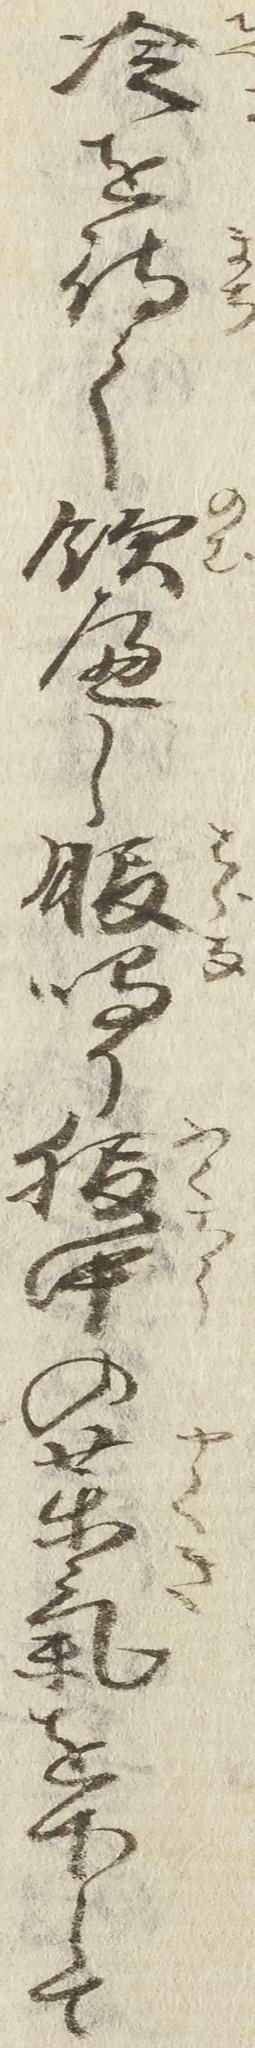冷を待て飲へし腹鳴り腹中の薬気を下して
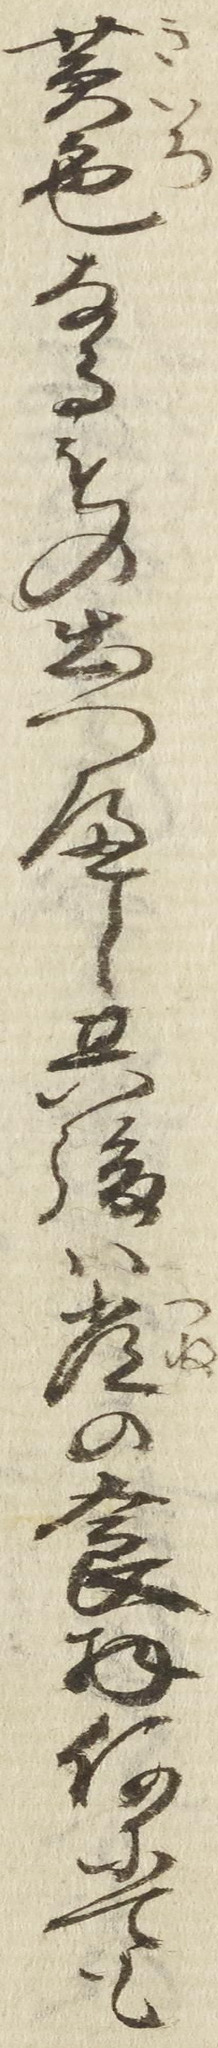黄色なるもの出つへし其後は常の食物何にても
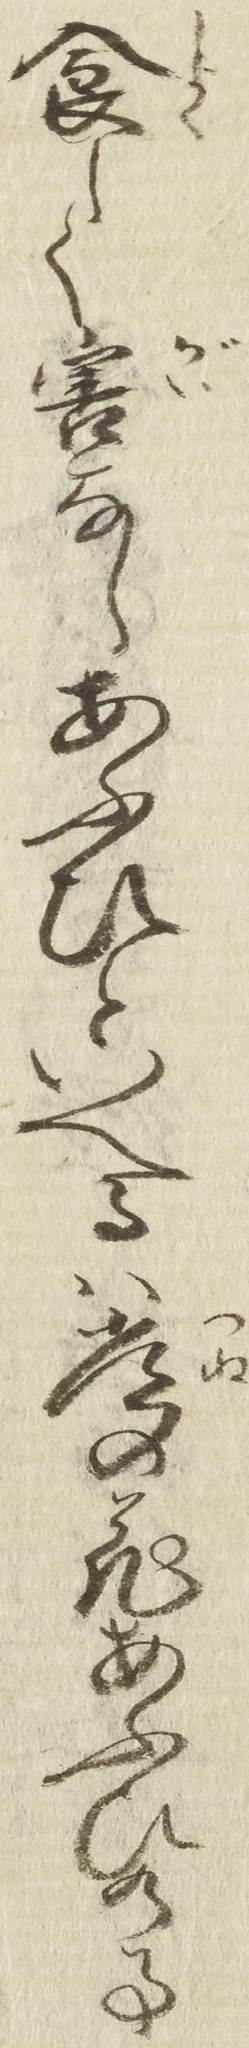食して害なしあふひといへるは常の花あふひの事
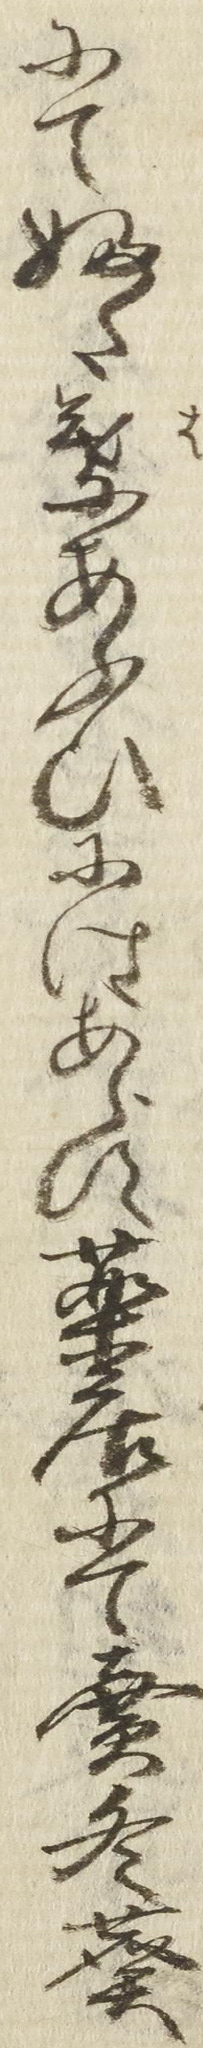にてふた葉あふひにはあらす薬店にて売冬葵
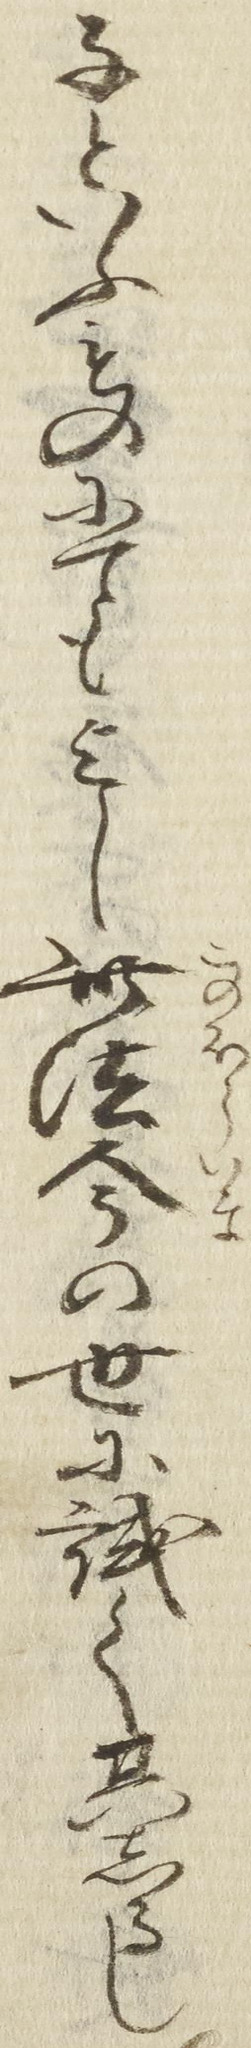といふものにてもよし此法今の世に試て其しるし
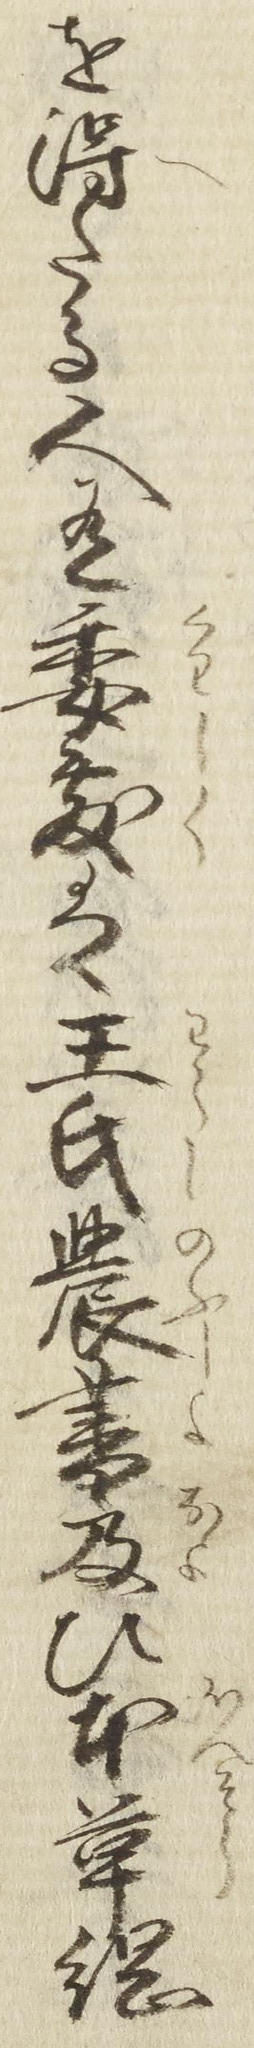を得たる人有委敷は王氏農書及ひ本草綱
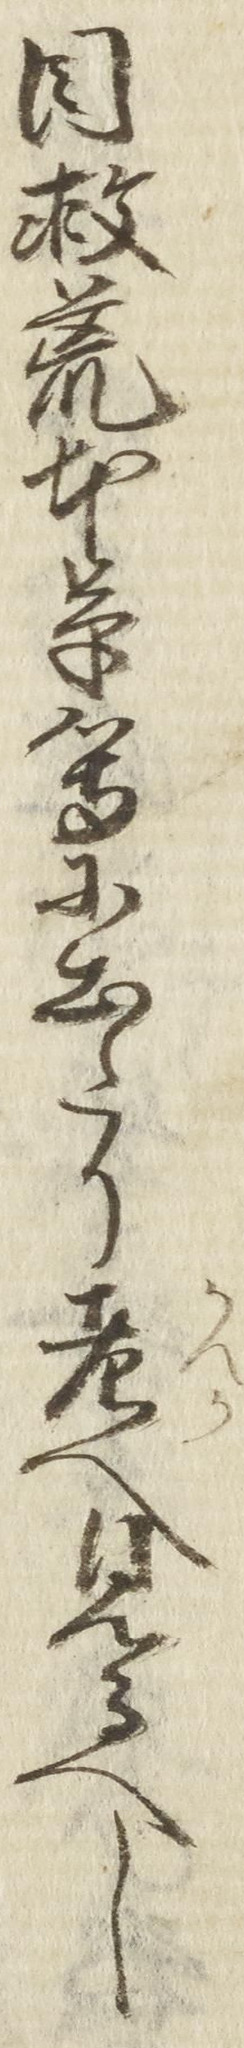目救荒本草等に出たり考へ見るへし
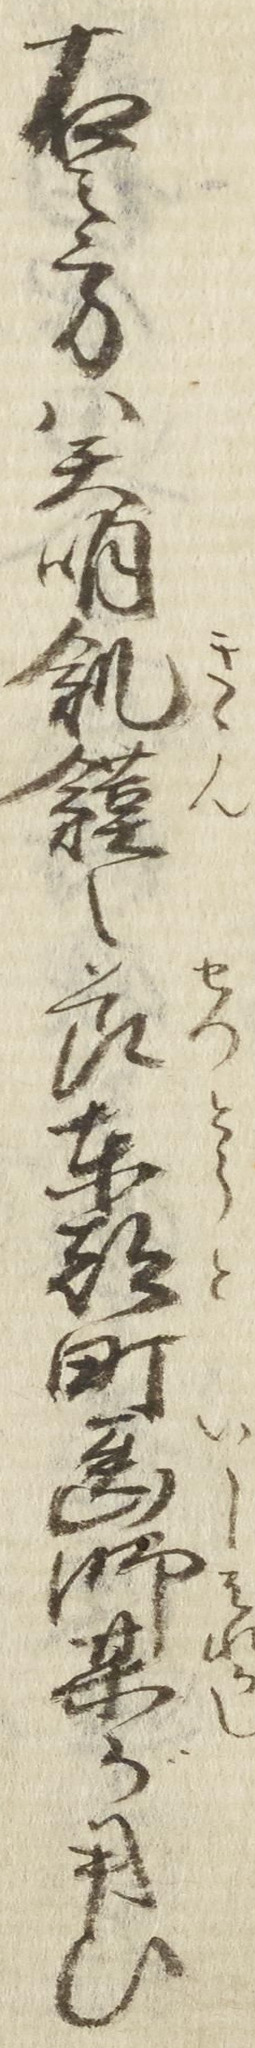右之方は天明飢饉之節東都町医師某が用ひ
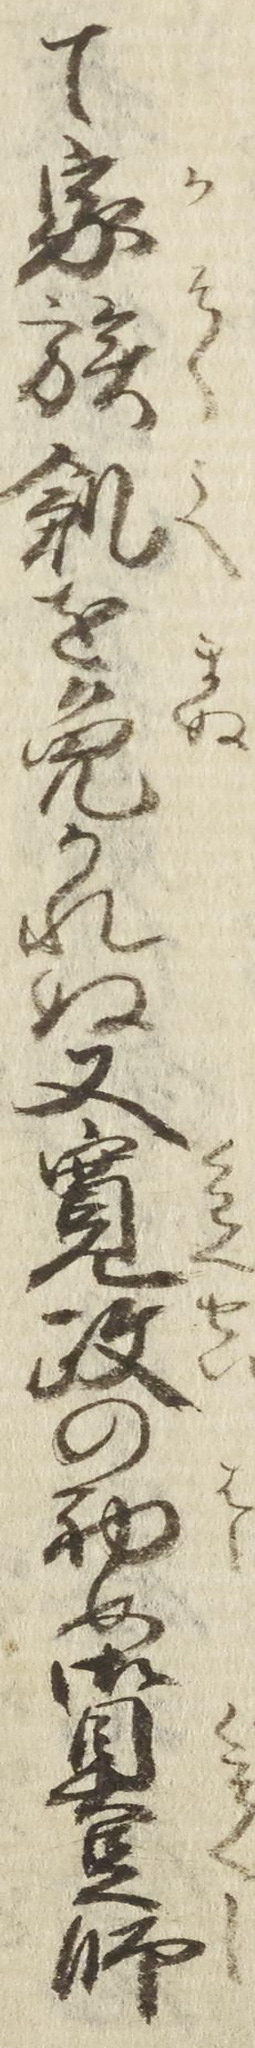て家族飢を免かれぬ又寛政の初め御具足師

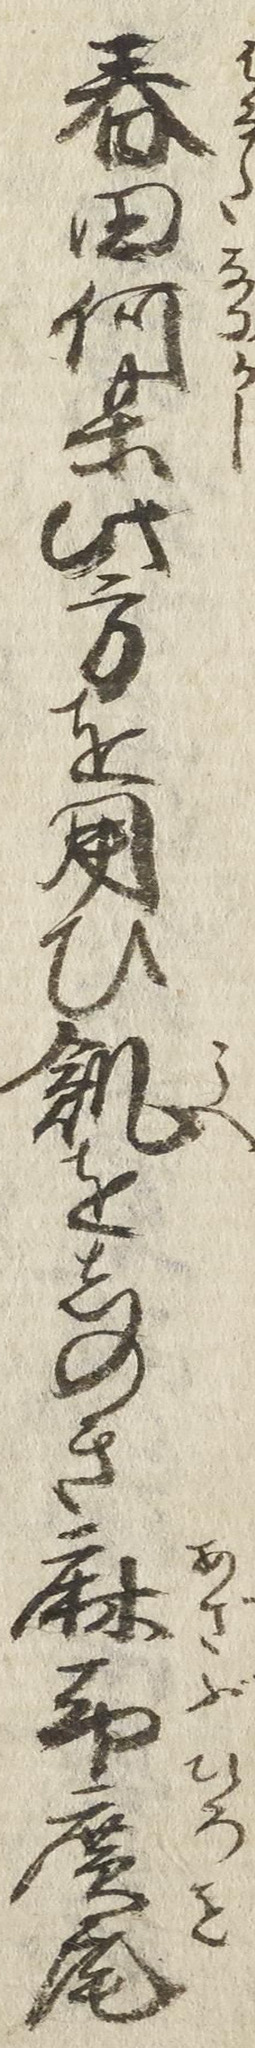春田何某此方を用ひ飢をしのき麻布広尾
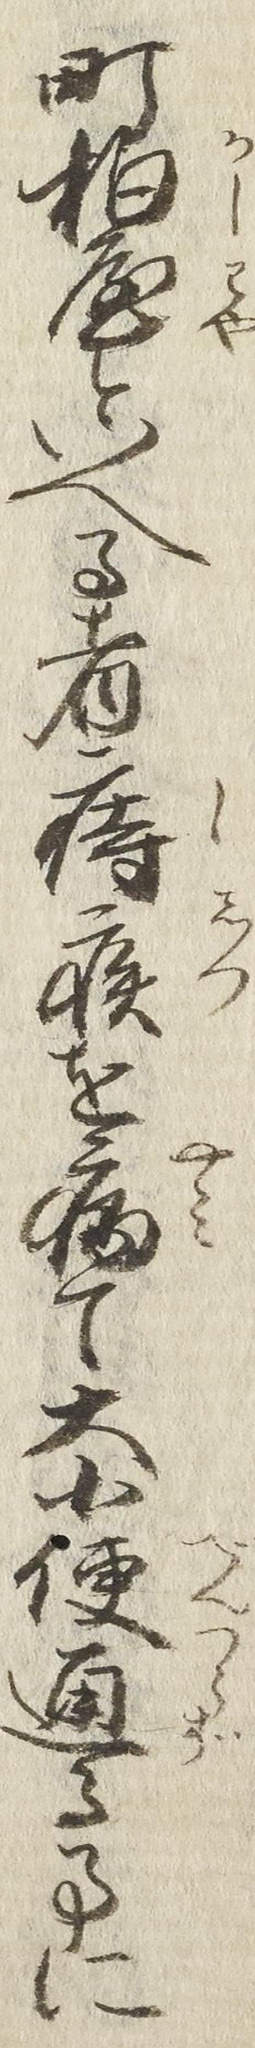町柏屋といへる者痔疾を病て大に便通る事に
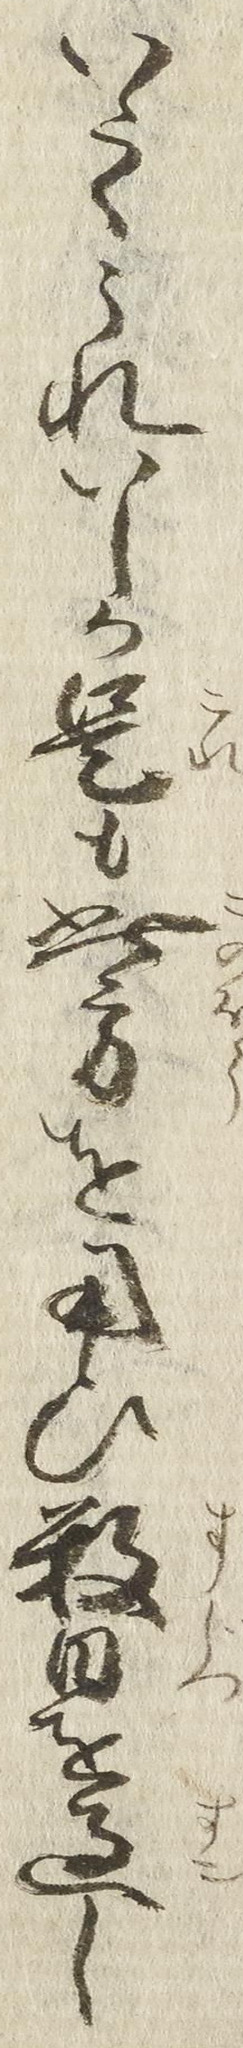いたくうれいしか是も此方を用ひ数日を過し
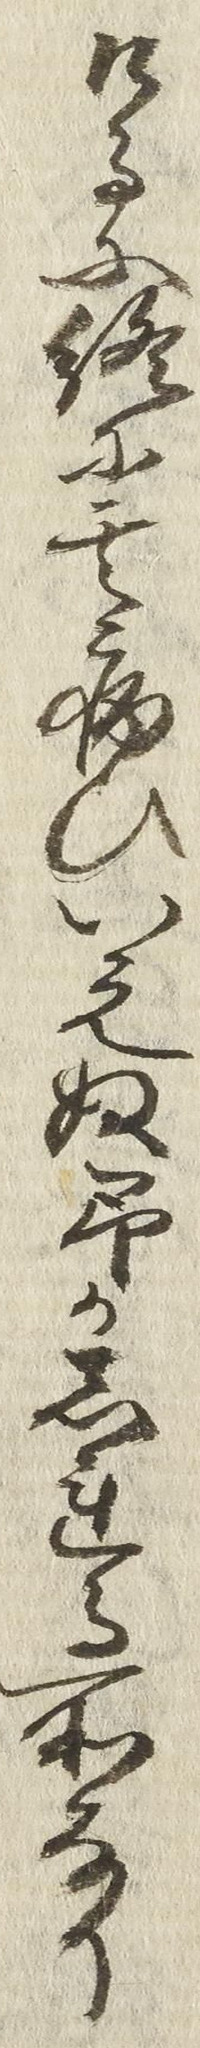けるに終に其病ひいえぬ予かしれる所なり
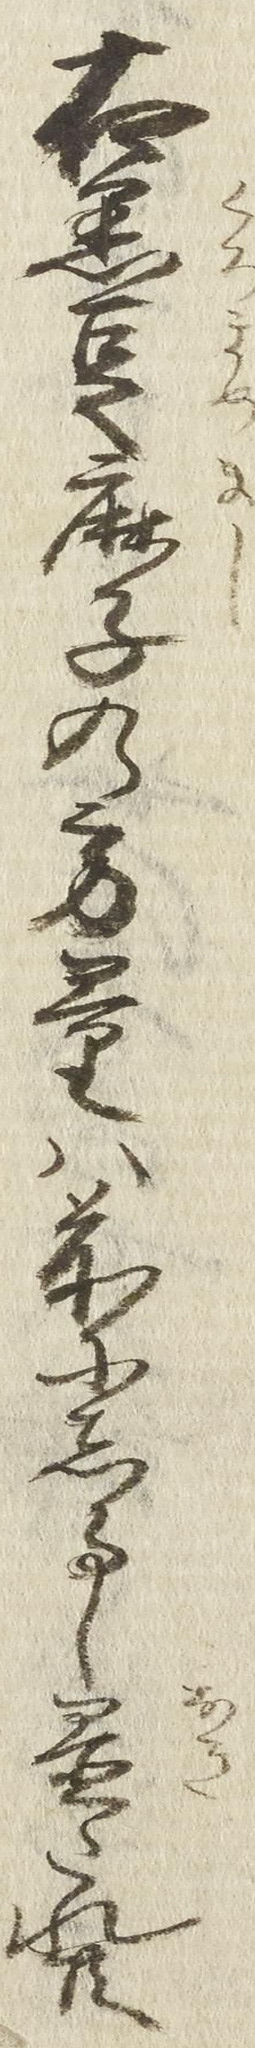右黒豆麻子の方量は前にしるし置たれ共
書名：天明奇畧　全
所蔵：東京大学地震研究所図書室 Earthquake Research Institute Library, The University of Tokyo, JAPAN
